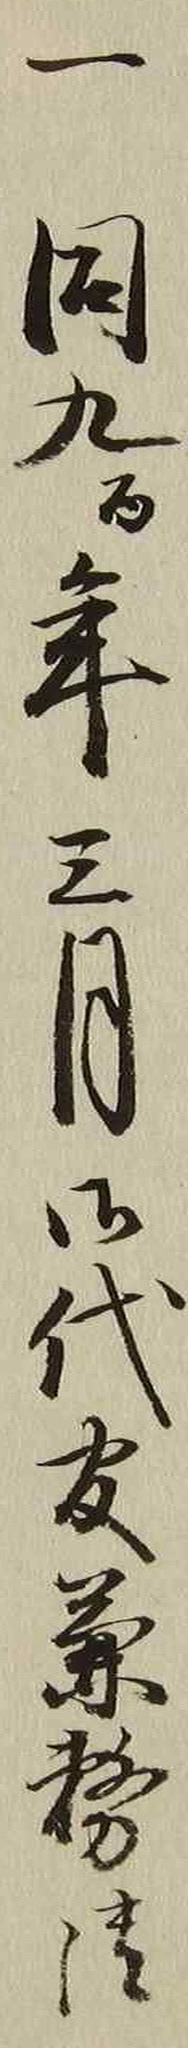一同九酉年三月御代官兼務御
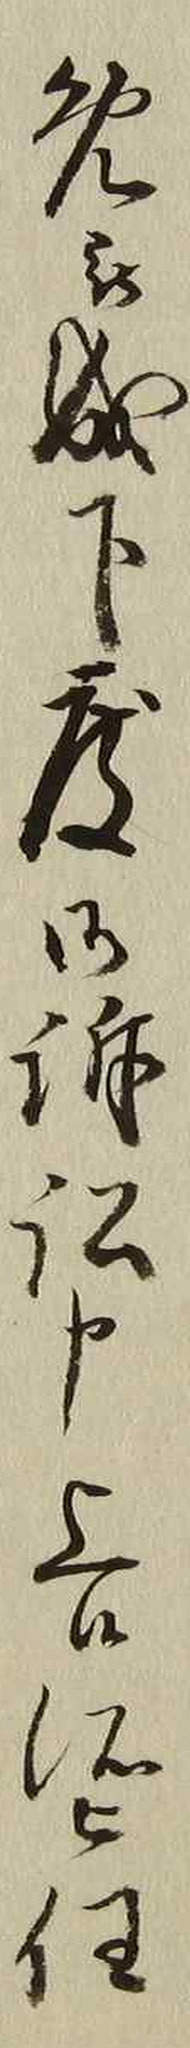免被成下度御訴訟申上候所被任
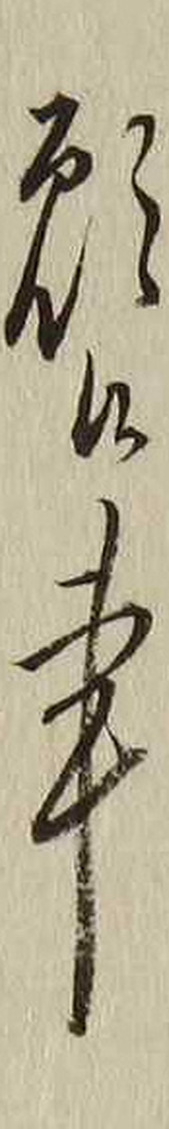願候事
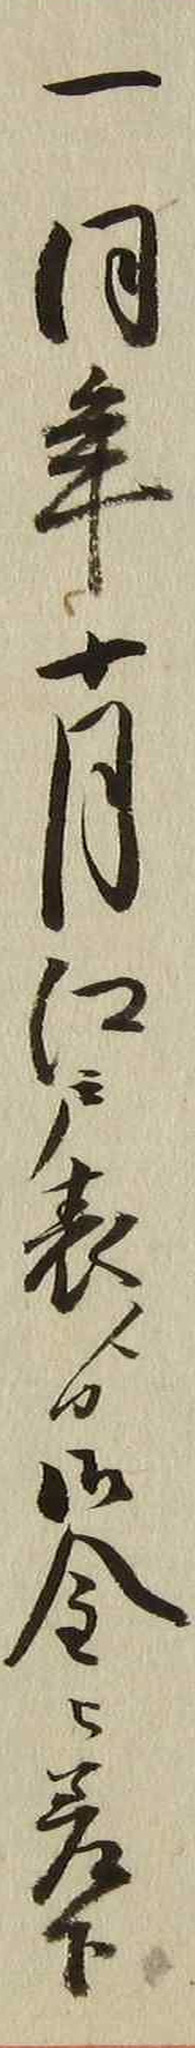一同年十月江戸表ゟ御金被差下
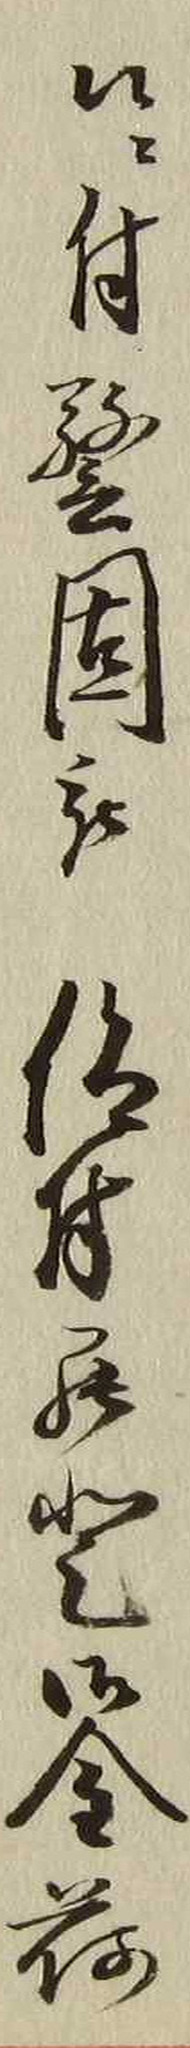候ニ付警固被仰付罷登御金荷
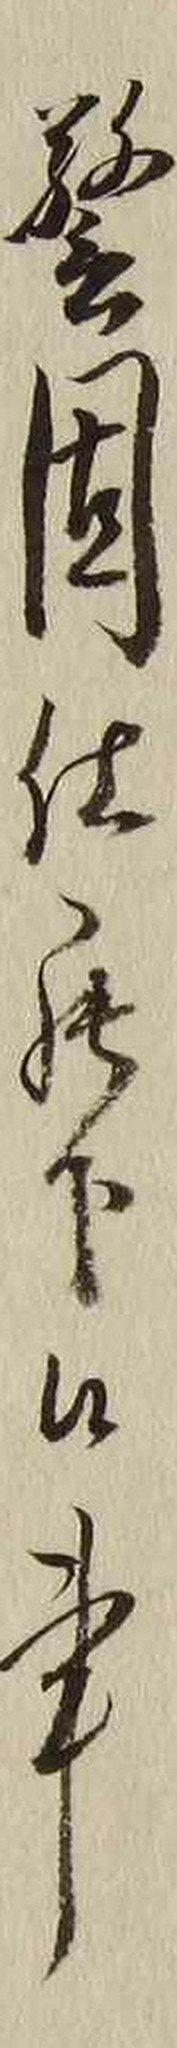警固仕罷下候事
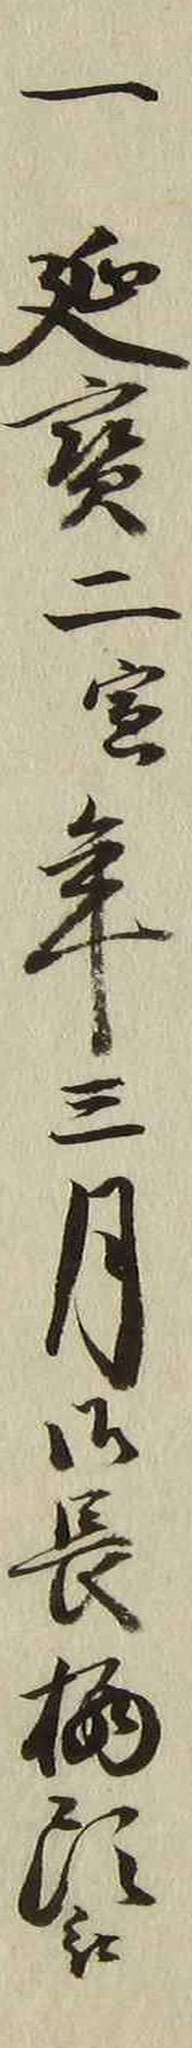一延宝二寅年三月御長柄頭被
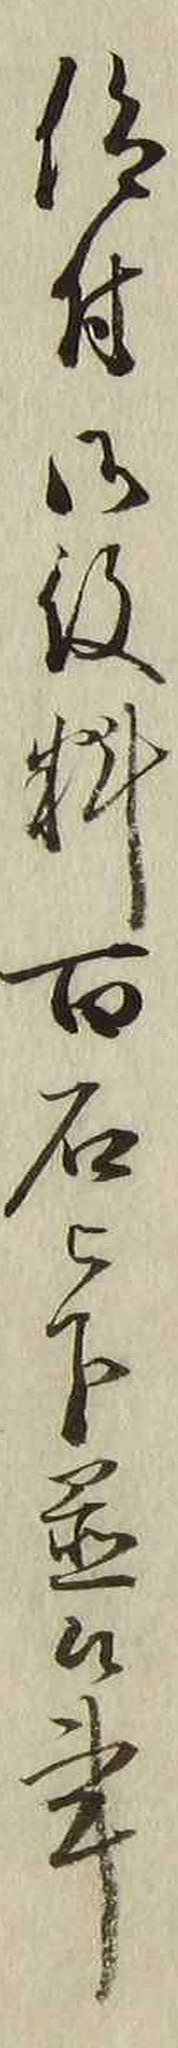仰付御役料百石被下置候事
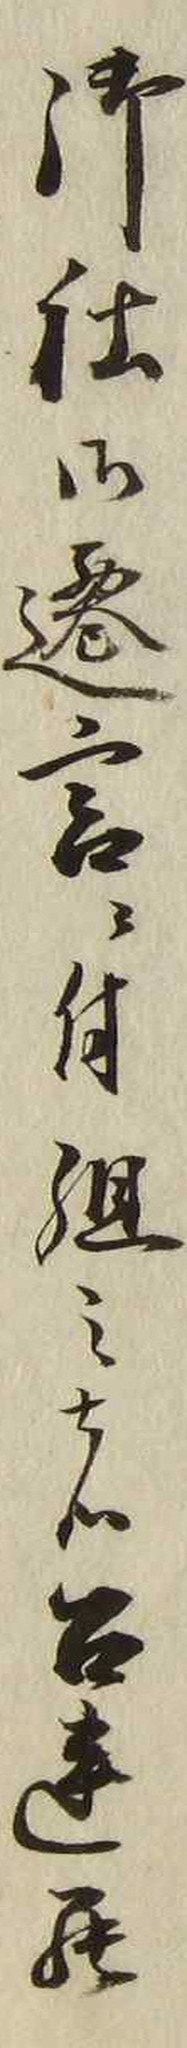御社遷宮ニ付組之者召連罷
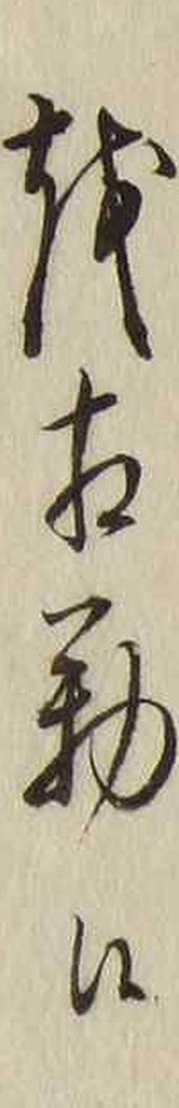越相勤候

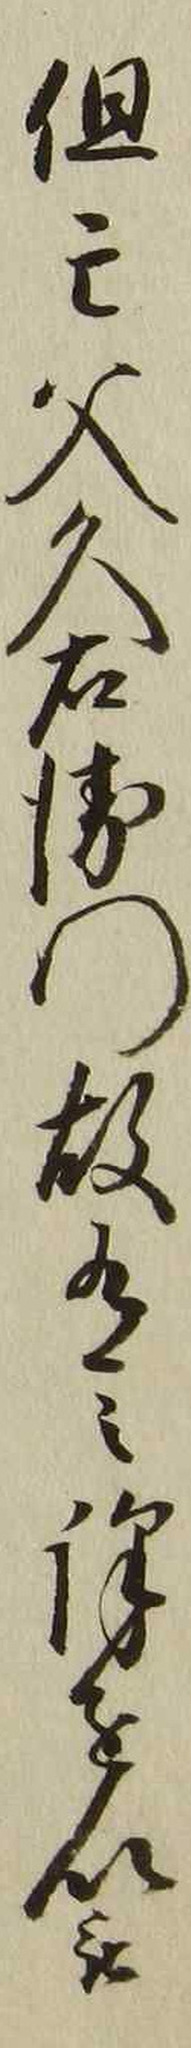但亡父久右衛門故有之訳を以被
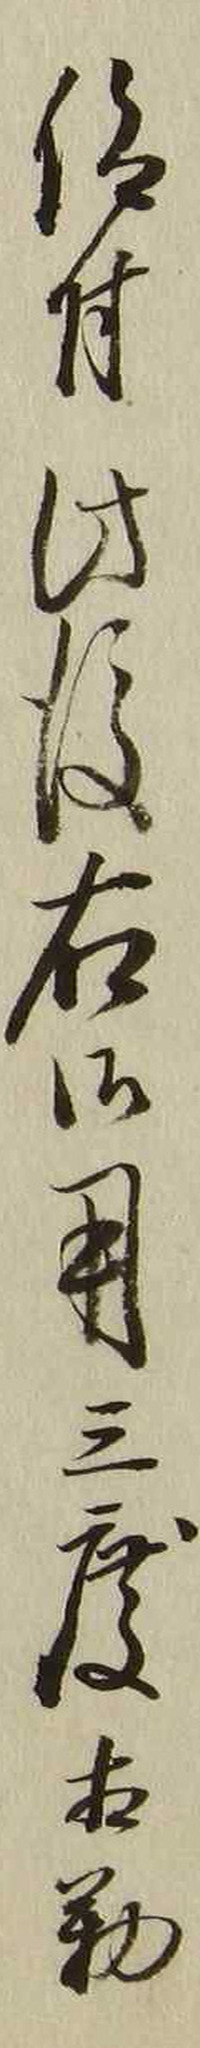仰付此後右御用三度相勤
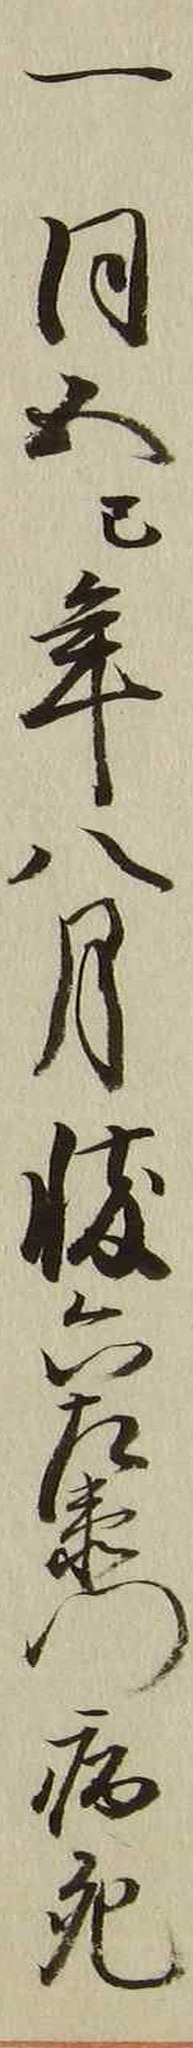一同五巳年八月忰六左衛門病死
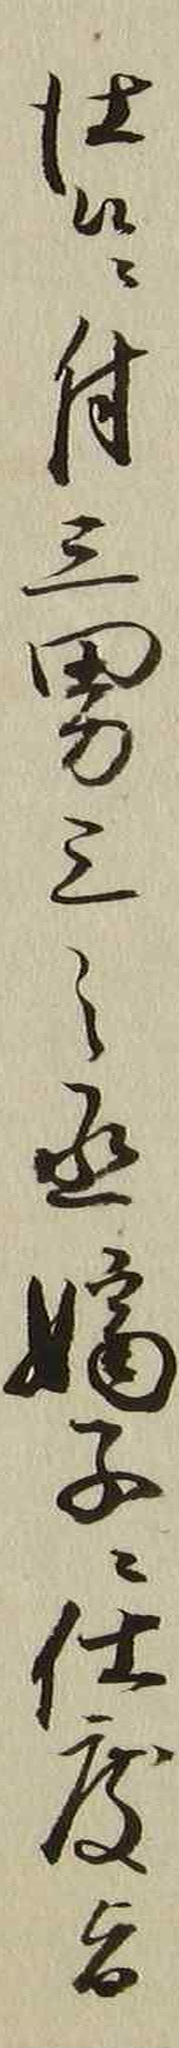仕候ニ付三男三之丞嫡子ニ仕度旨
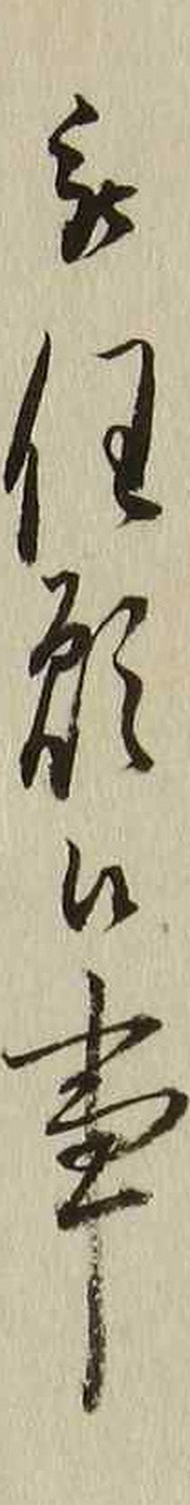被任願候事
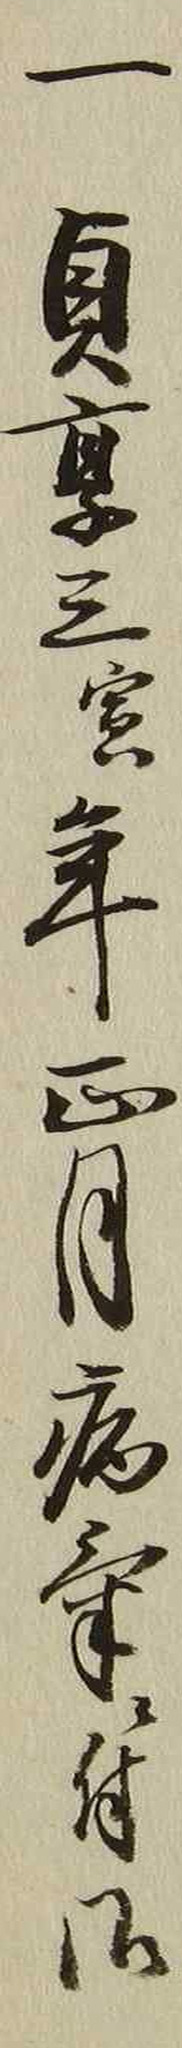一貞享三寅年正月病気ニ付御
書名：諸士系譜　巻之69　を之部3
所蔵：会津若松市立会津図書館
